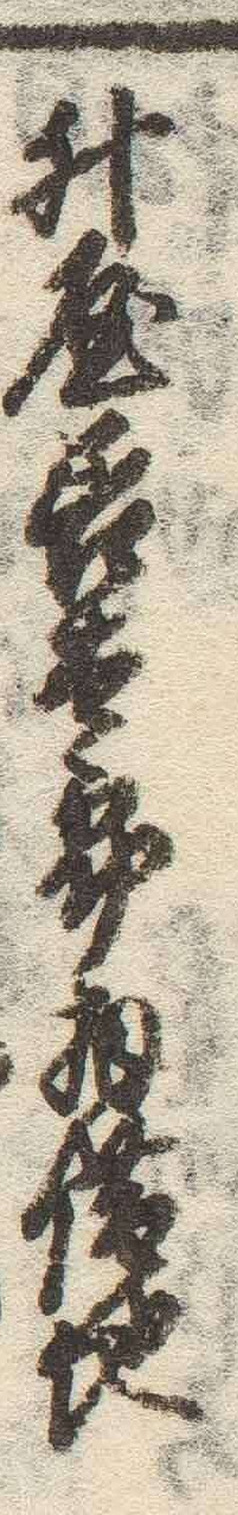升屋善太郎拝借地
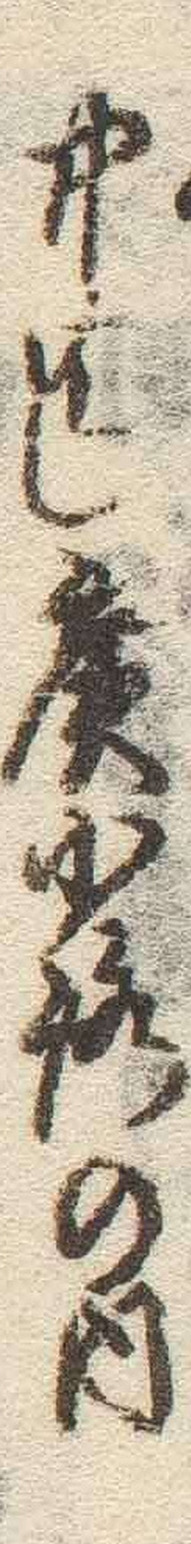中はし広小路の内
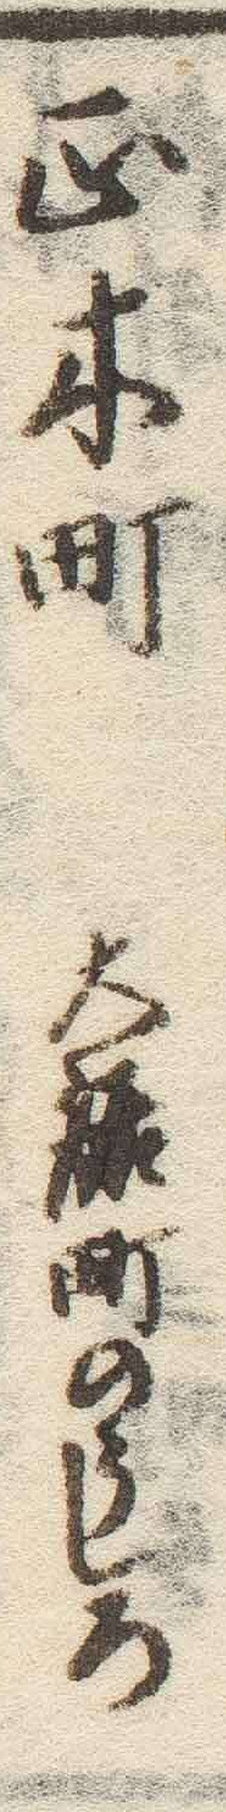正木町大鋸町のうしろ
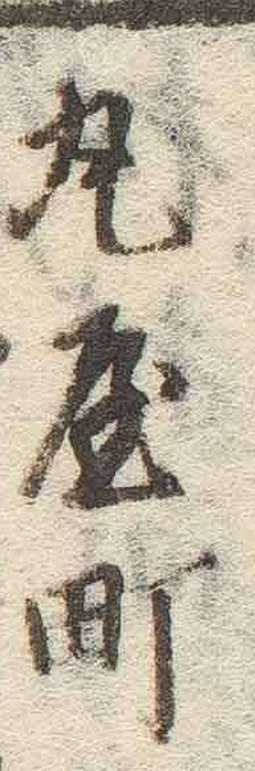丸屋町
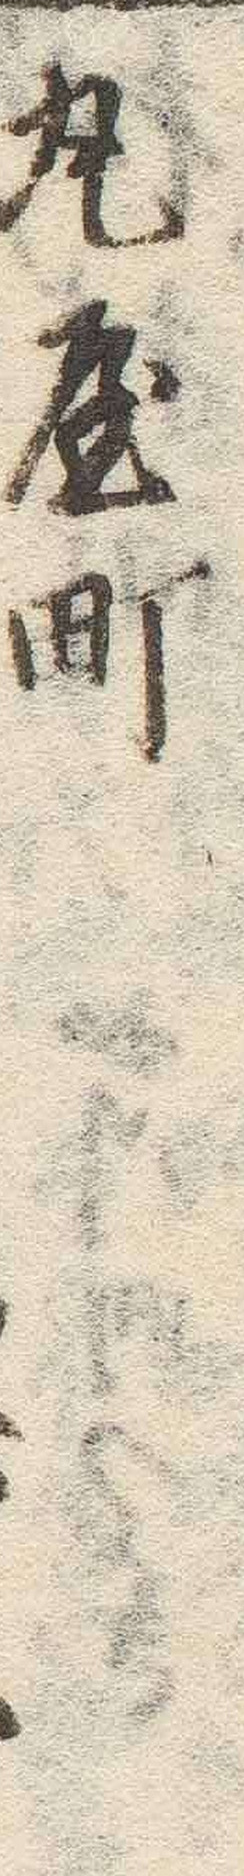丸屋町
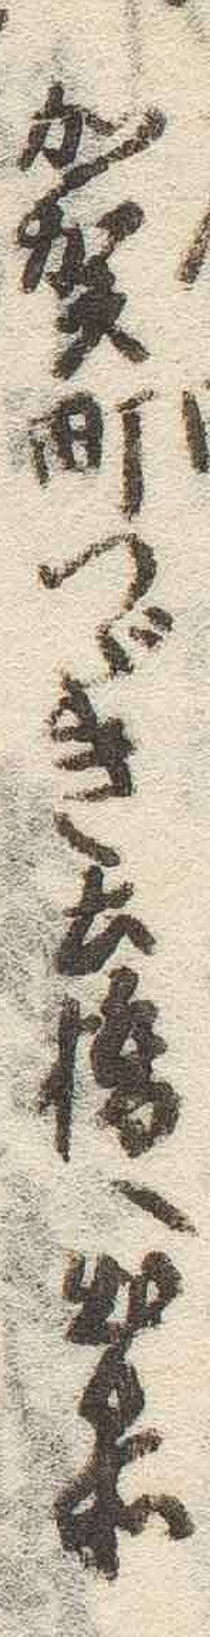加賀町つゞき土橋へ出る所
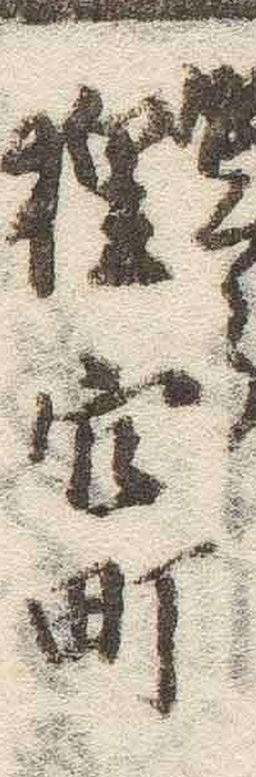狸穴町
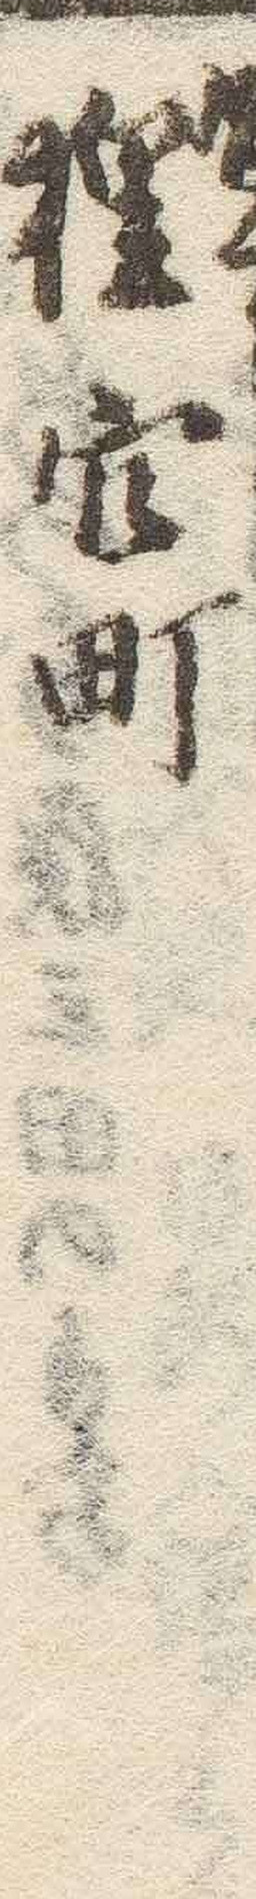狸穴町
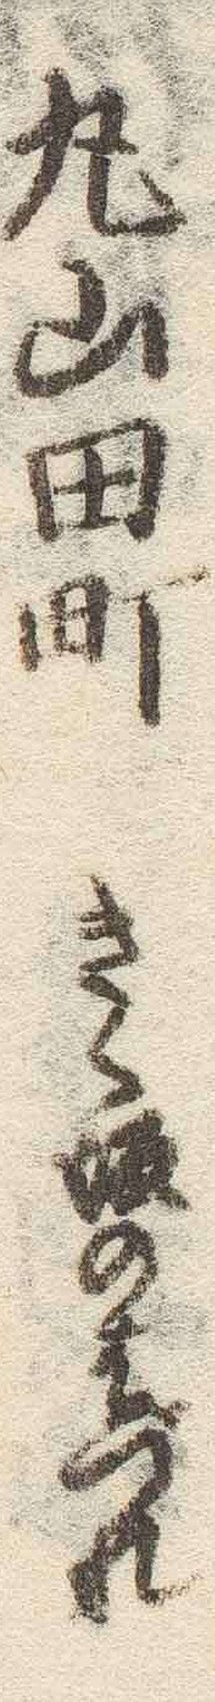丸山田町きく坂のはづれ
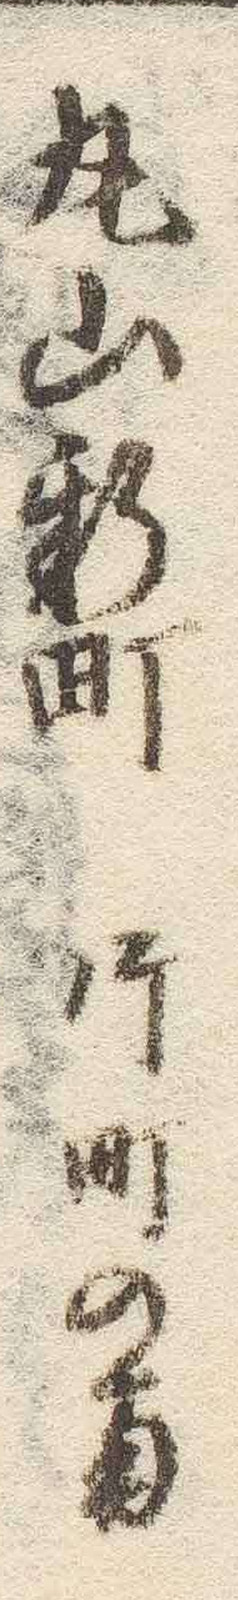丸山新町片町の南
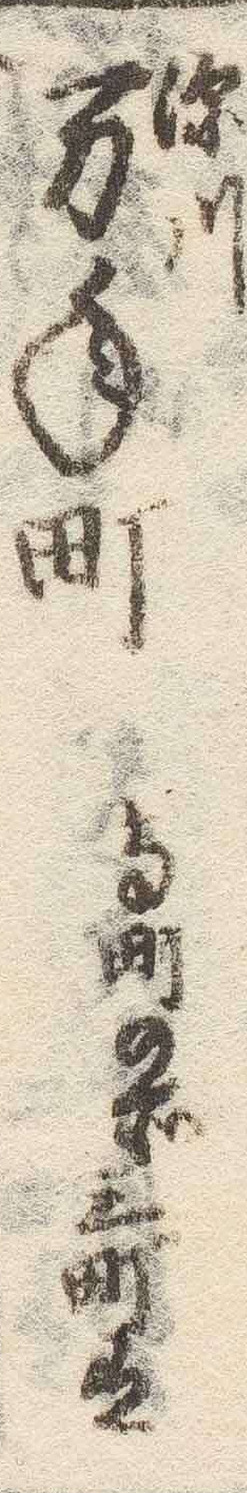万年町寺町の所三町有
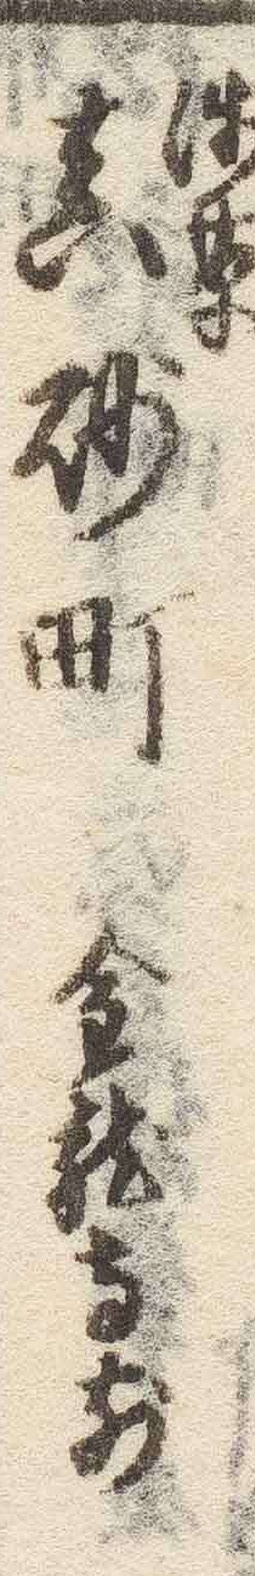真砂町金龍寺前
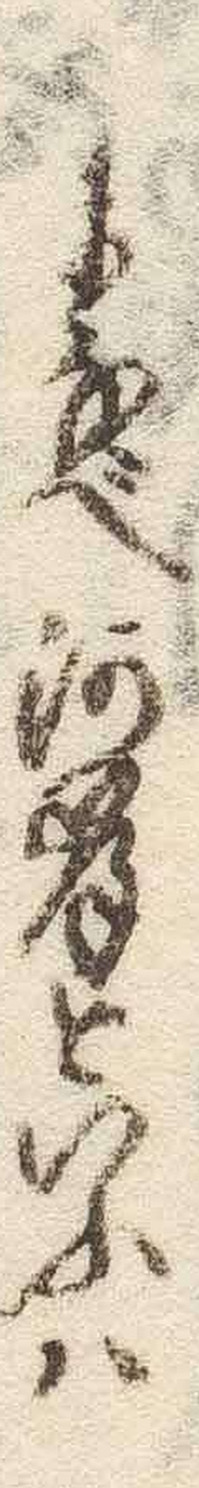まなべ河岸といふは
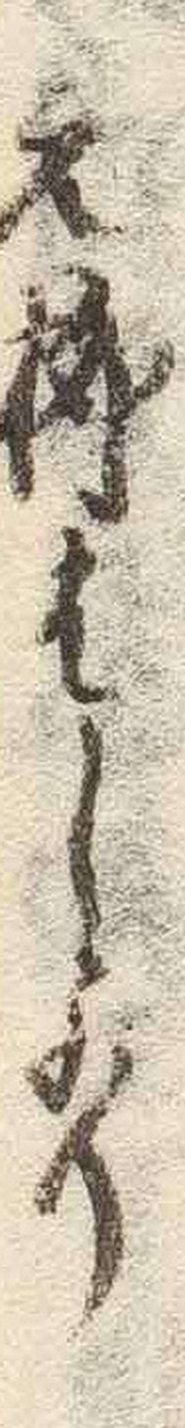元柳はしより
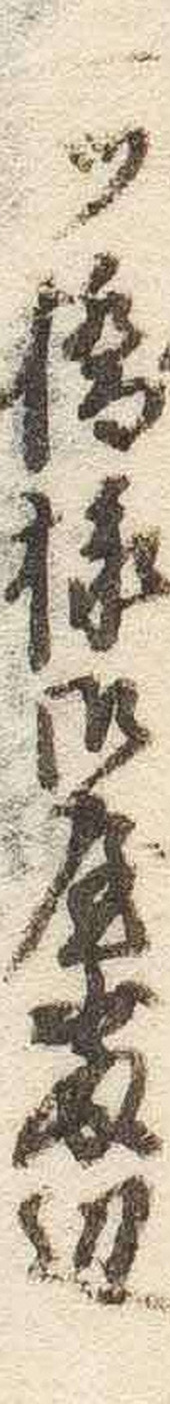一ッ橋様御屋敷辺
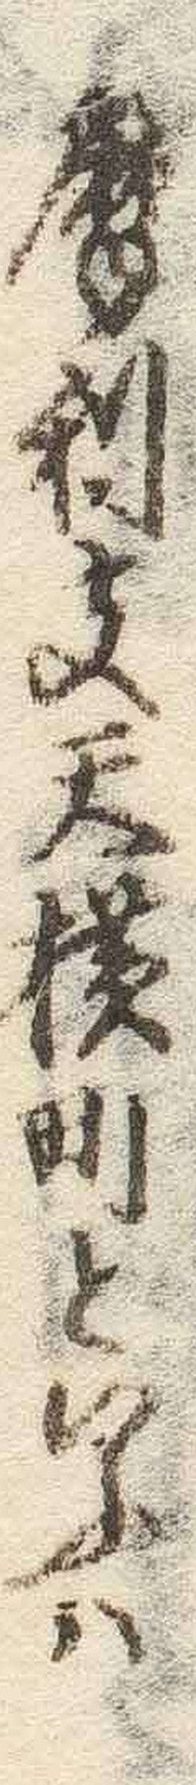摩利支天横町といふは
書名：江戸町独案内
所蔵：東京学芸大学附属図書館 国文学研究資料館
